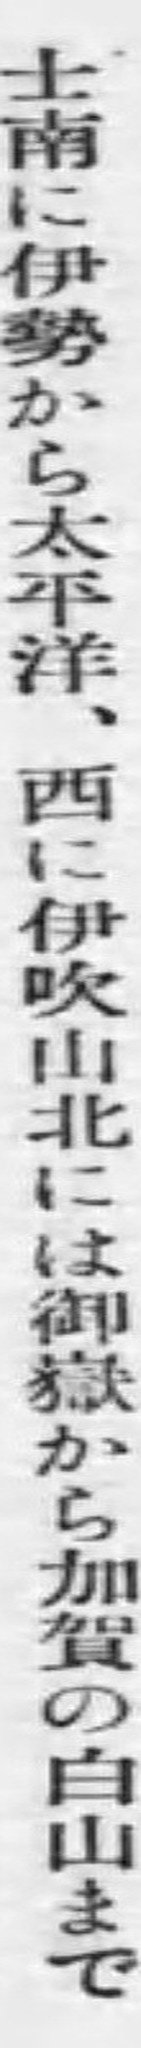士南に伊勢から太平洋、西に伊吹山北には御嶽から加賀の白山まで
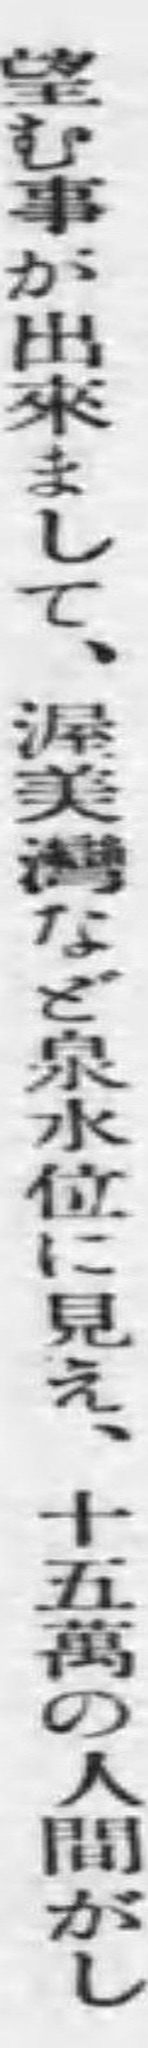望む事が出来まして、渥美湾など泉水位に見え、十五万の人間がし
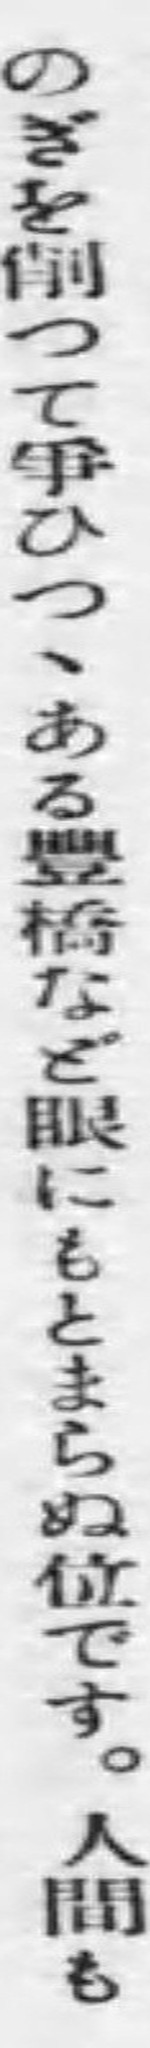のぎを削つて争ひつゝある豊橋など眼にもとまらぬ位です。人間も
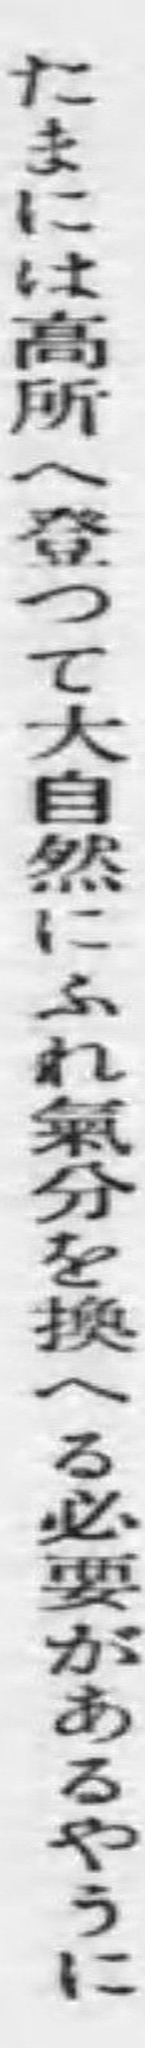たまには高所へ登つて大自然にふれ気分を換へる必要があるやうに
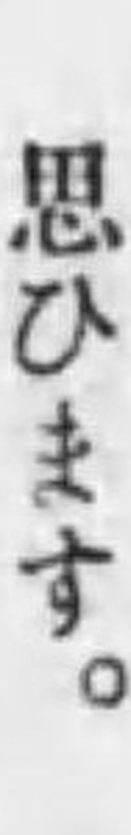思ひます。
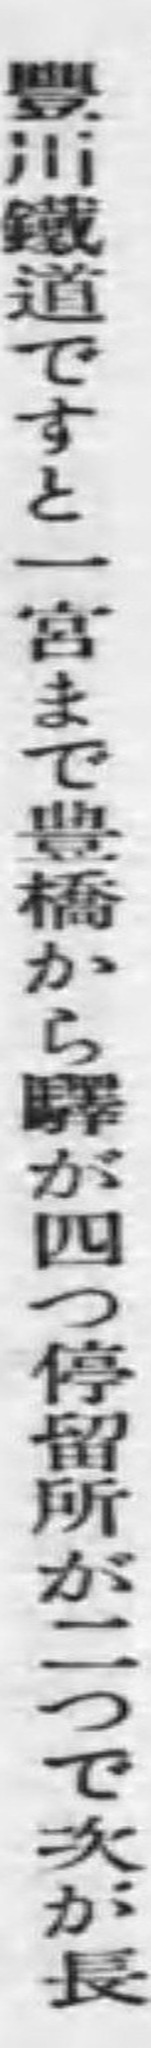豊川鉄道ですと一宮まで豊橋から駅が四つ停留所が二つで次が長
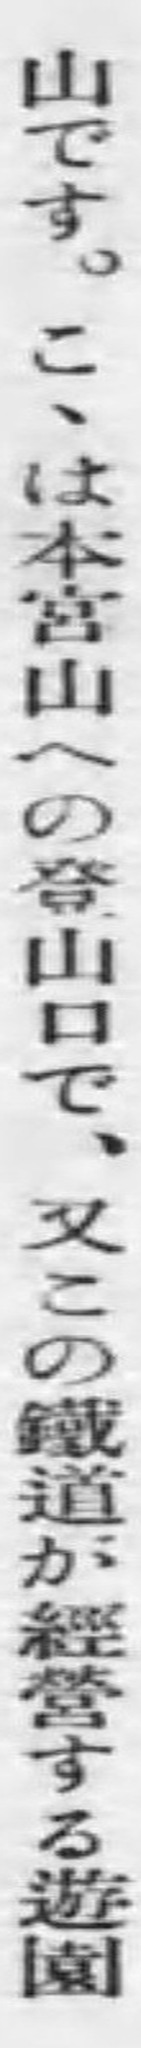山です。こゝは本宮山への登山口で、又この鉄道が経営する遊園
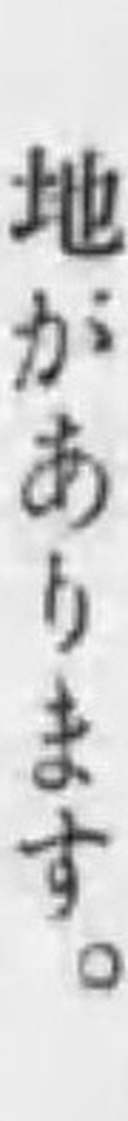地があります。
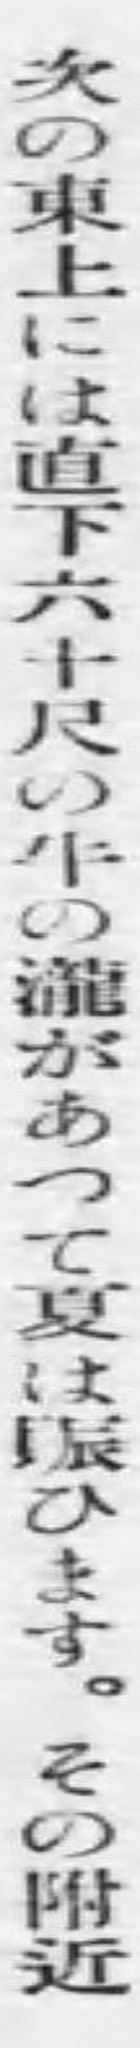次の東上には直下六十尺の牛の瀧があつて夏は賑ひます。その附近
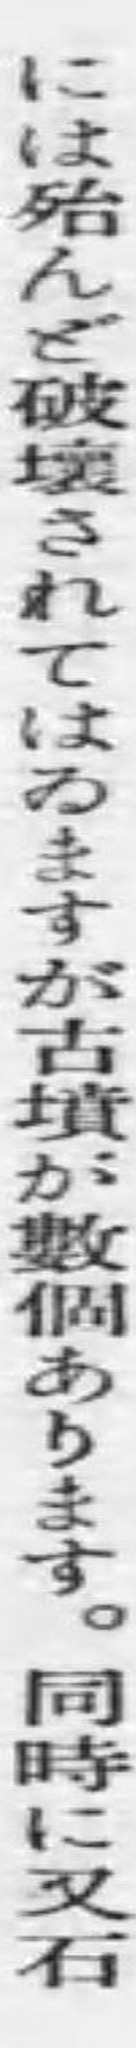には殆んど破壊されてはゐますが古墳が数個あります。同時に又石
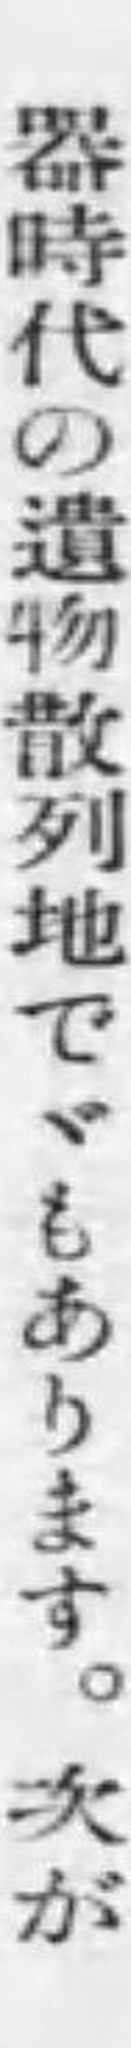器時代の遺物散列地でゞもあります。次が
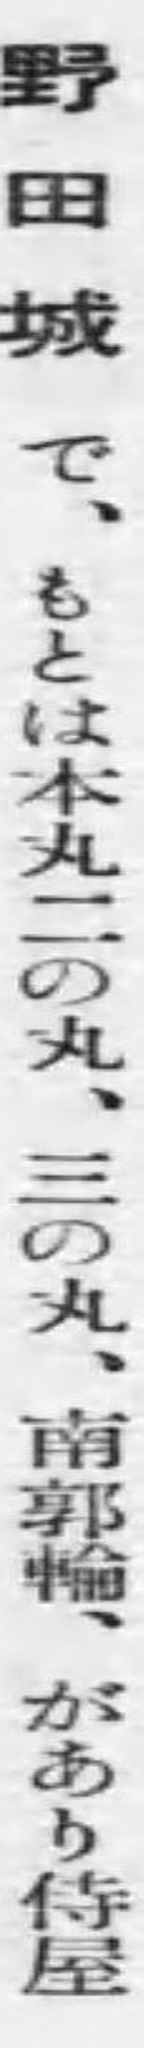野田城で、もとは本丸二の丸、三の丸、南郭輪、があり侍屋
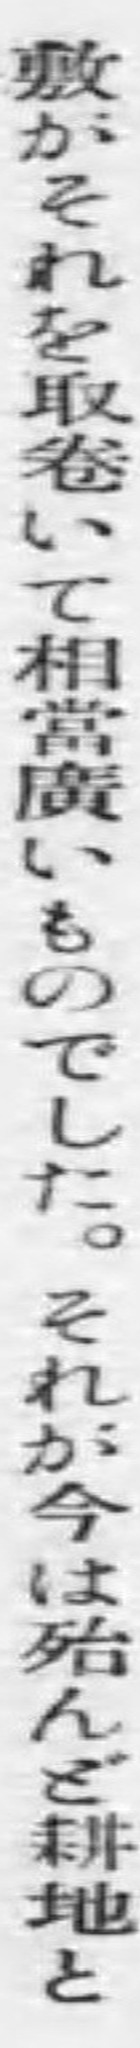敷がそれを取巻いて相当広いものでした。それが今は殆んど耕地と
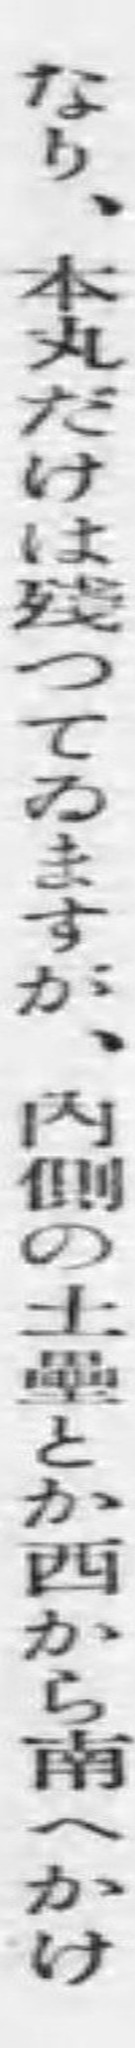なり、本丸だけは残つてゐますが、内側の土塁とか西から南へかけ
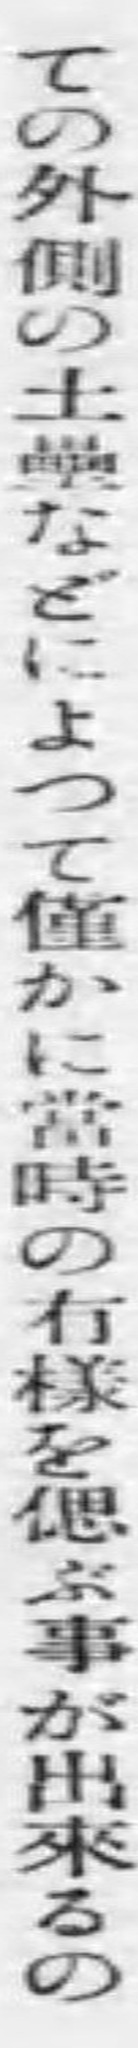ての外側の土塁などによつて僅かに当時の有様を偲ぶ事が出来るの
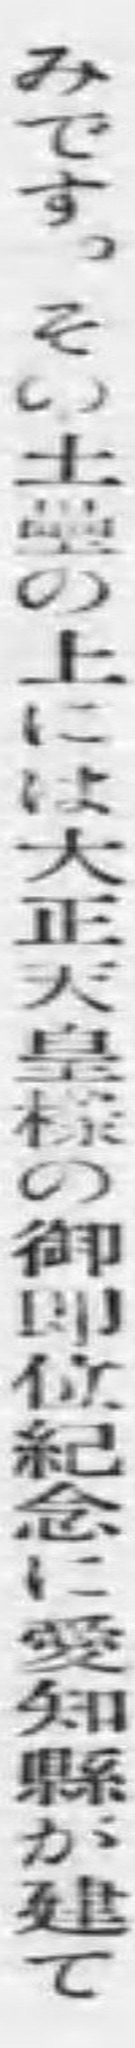みです。その土塁の上には大正天皇様の御即位紀念に愛知県が建て
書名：東三河道中記 : 豊橋市及其附近案内
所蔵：国立国会図書館 National Diet Library, JAPAN
